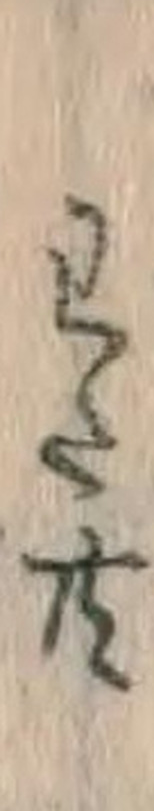わた共
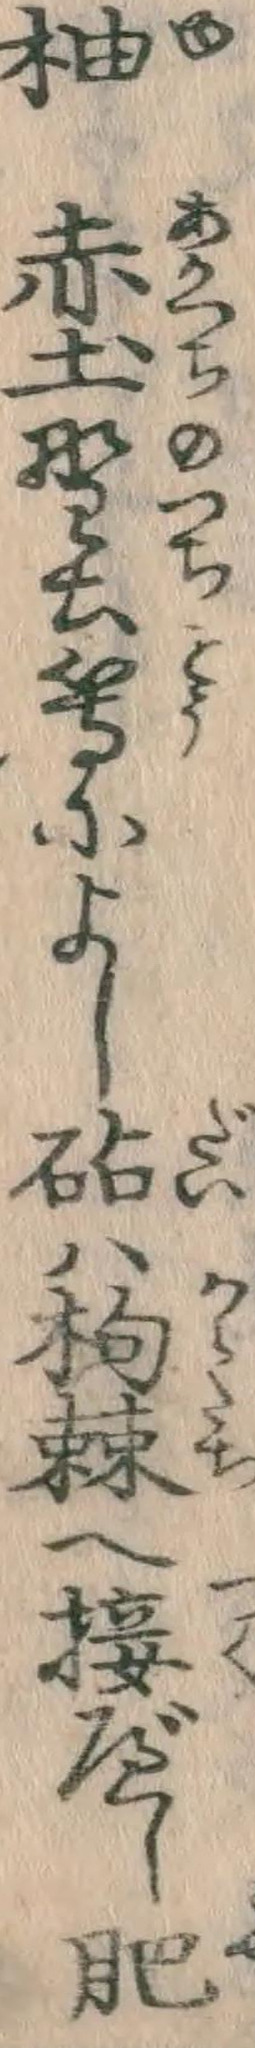一柚赤土野土等によし砧は枸棘へ接べし肥
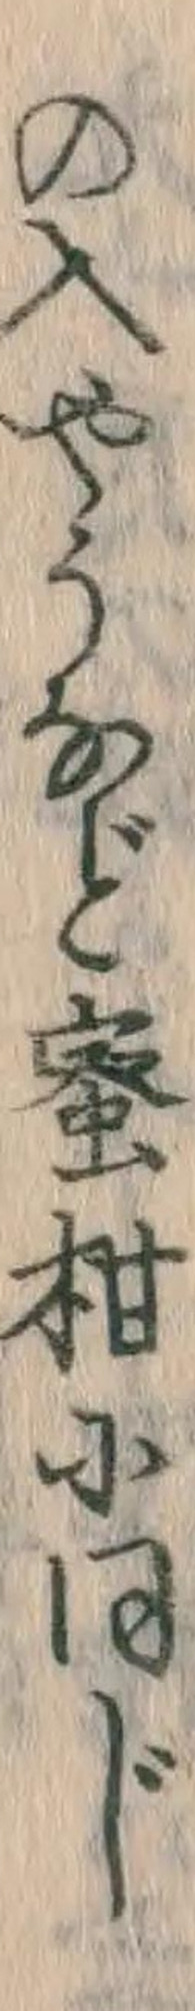の入やうなど蜜柑に同じ
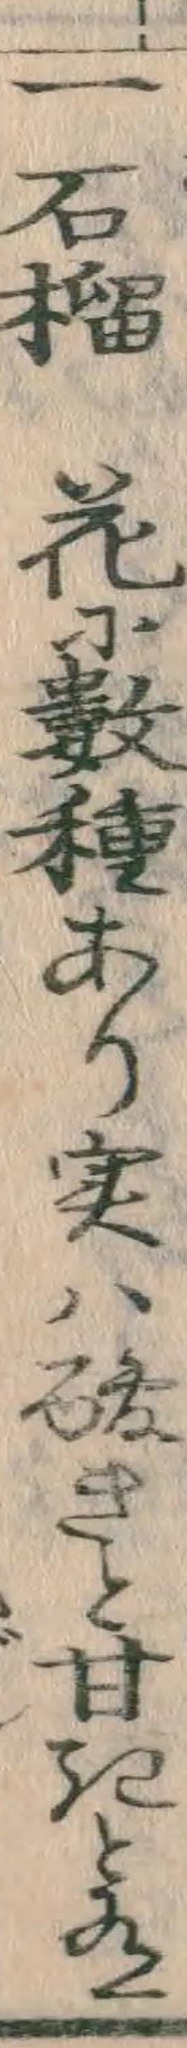一石榴花に数種あり実は酸きと甘きと有
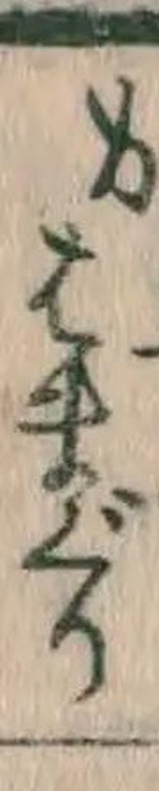はまぐり
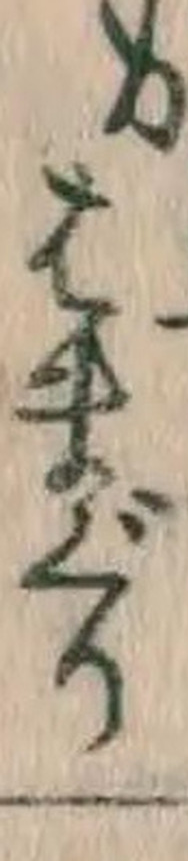はまぐり
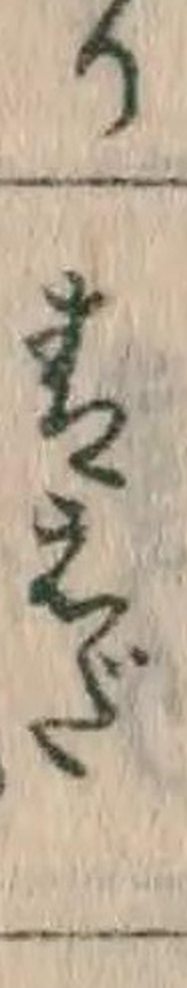青えだ
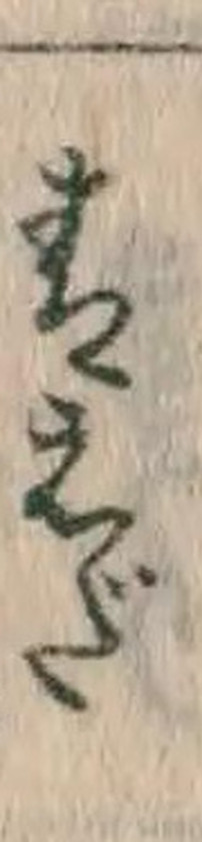青えだ
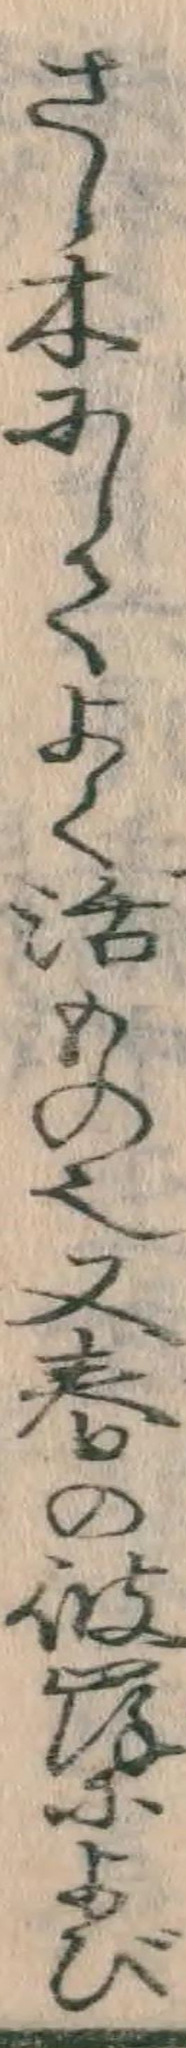さし木にしてよく活もの也又春の彼岸によび
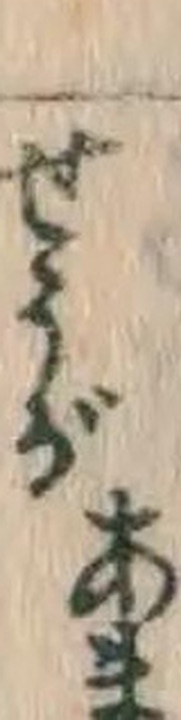せうがう
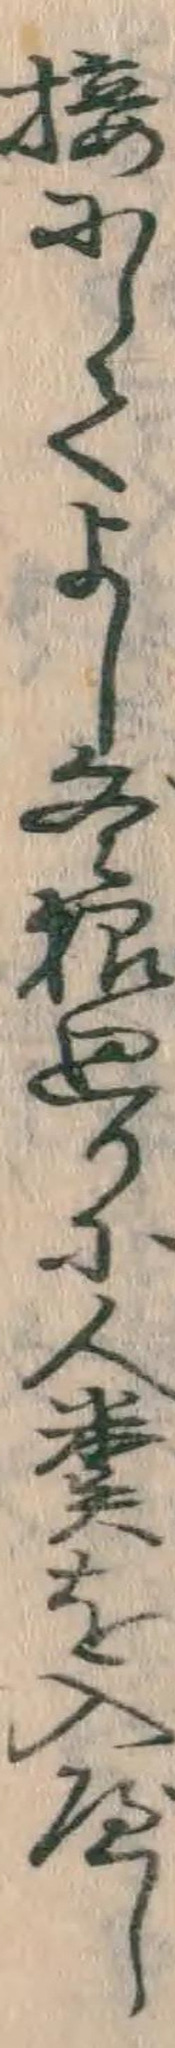接にしてよし冬根廻りに人糞を入べし
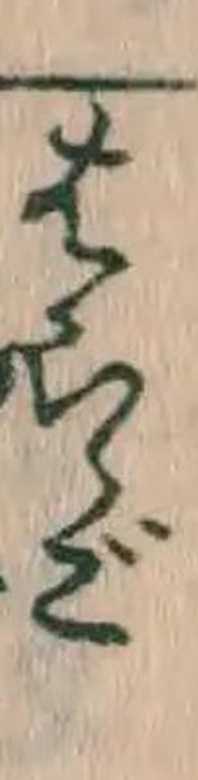はらゝご
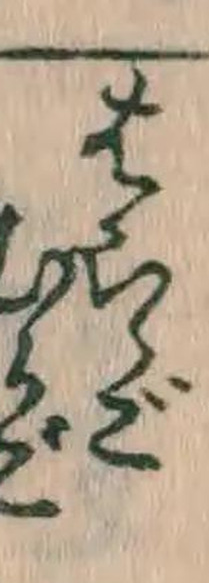はらゝご
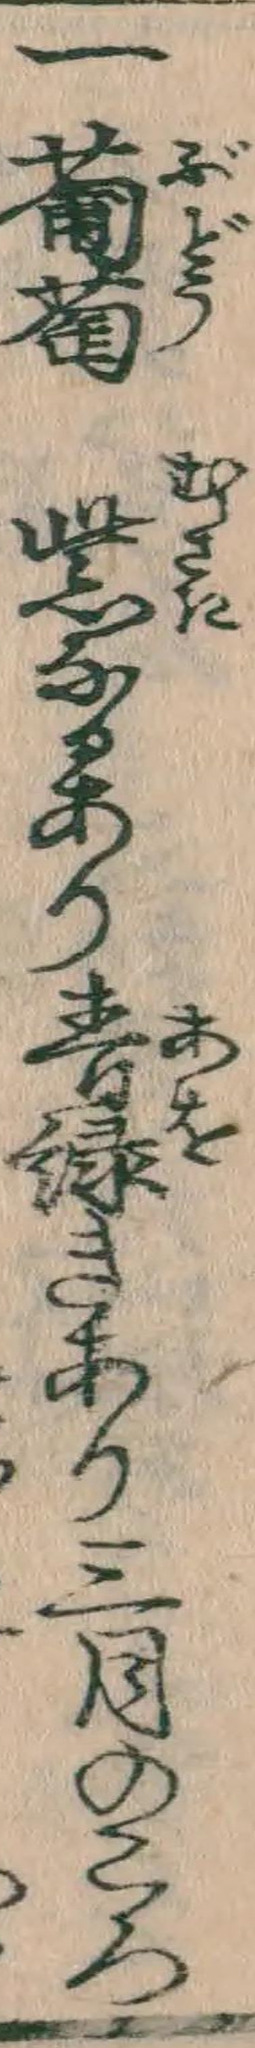一葡萄紫なるあり青緑きあり三月のころ
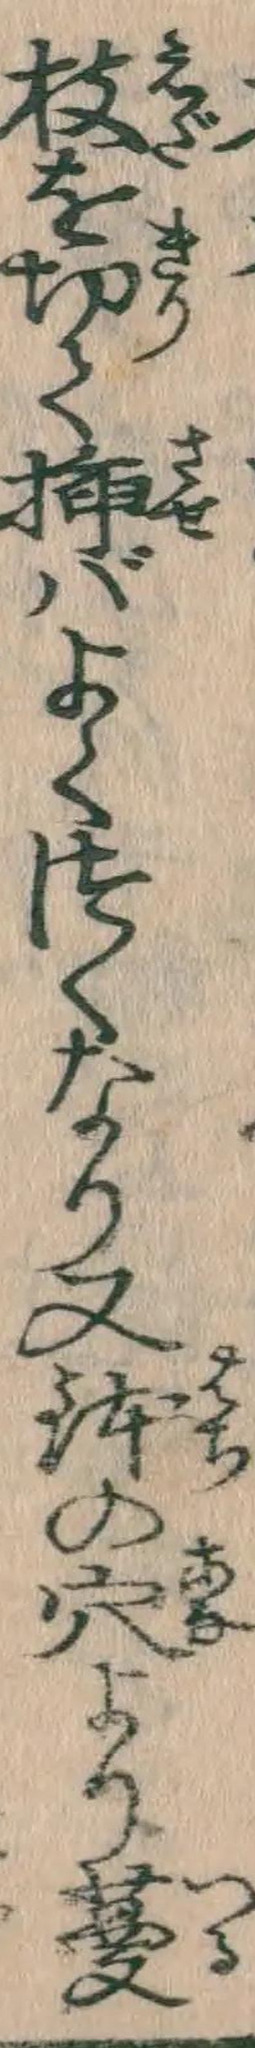枝を切て挿ばよくつくなり又鉢の穴より蔓
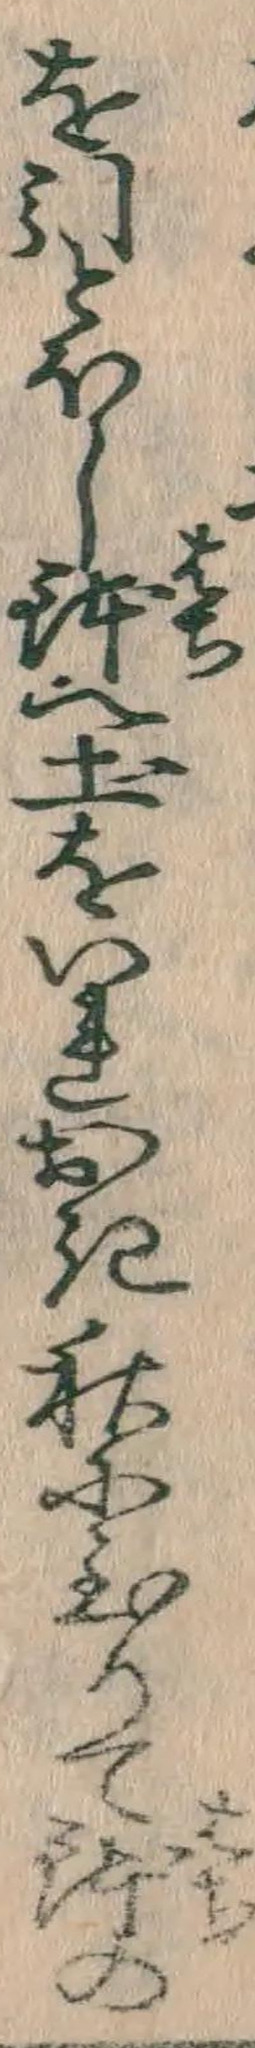を引とほし鉢へ土をいれおき秋に至りて鉢の
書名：広益秘事大全 3巻. [5]
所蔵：国立国会図書館 National Diet Library, JAPAN
